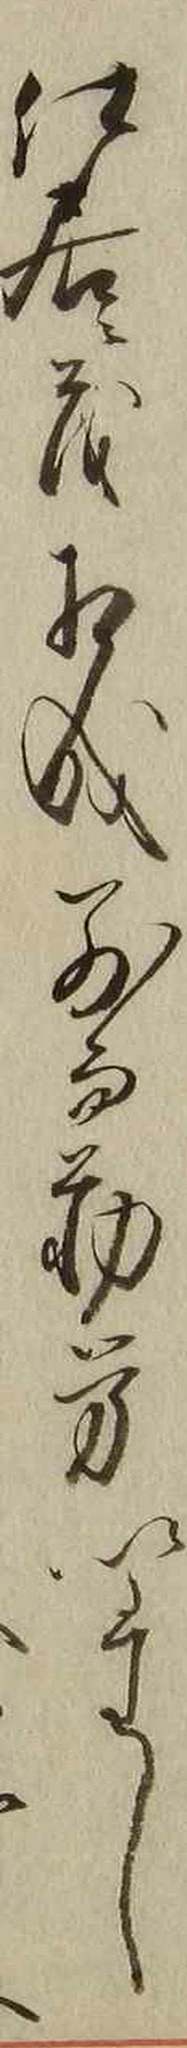仕居ニも相成別而勤労いたし
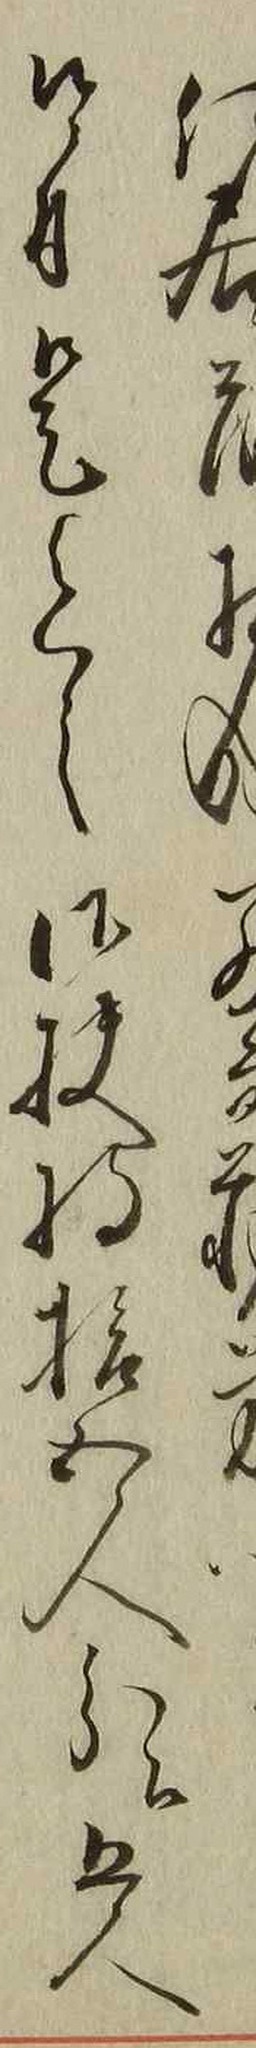候ニ付是迄之御扶持拾五人分江五人
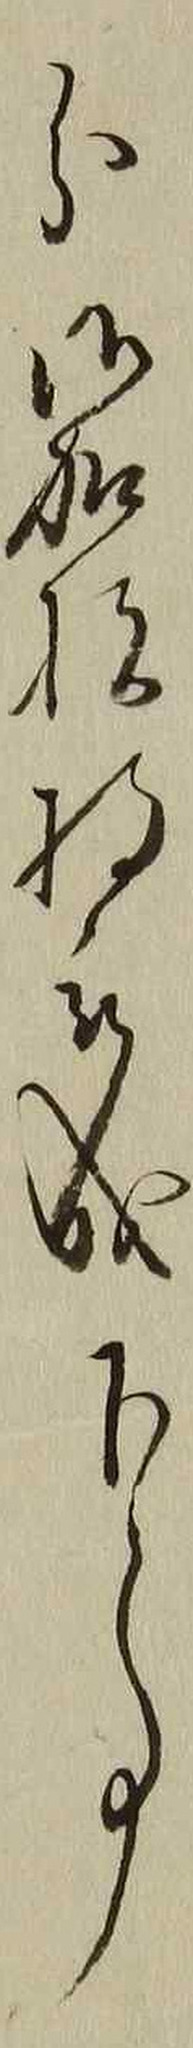分御加指持被成下候事
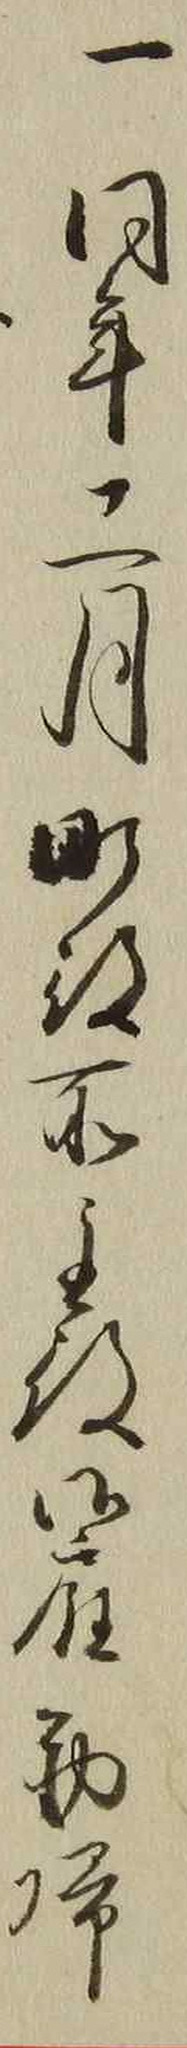一同年十一月町役所主役御雇勤帰
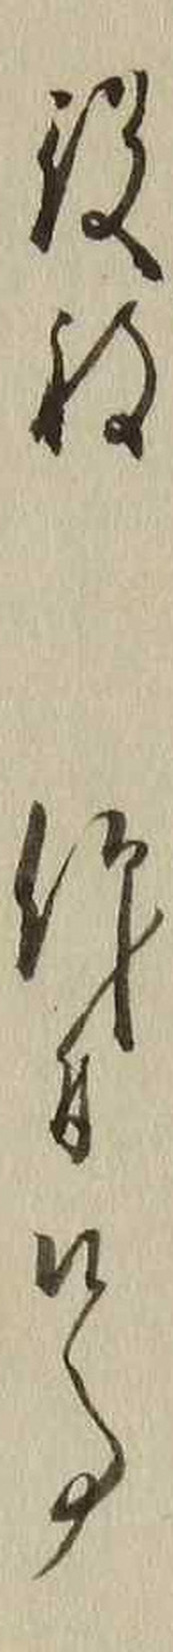役被仰付候事
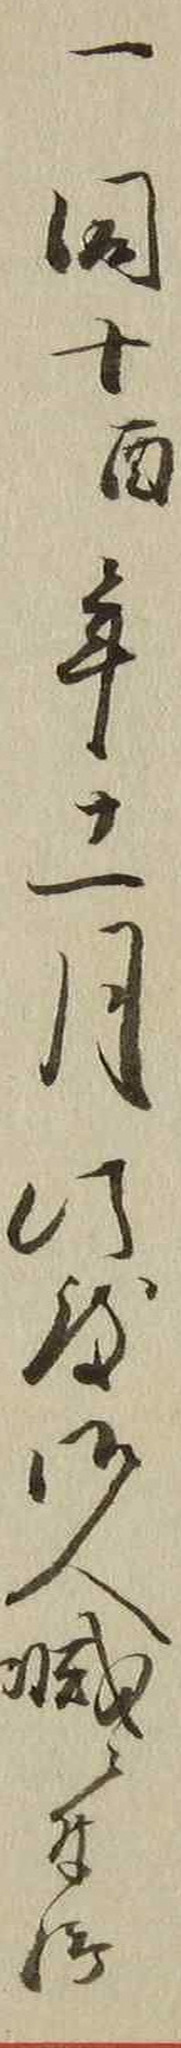一同十酉年十一月此度御人減ニ付御
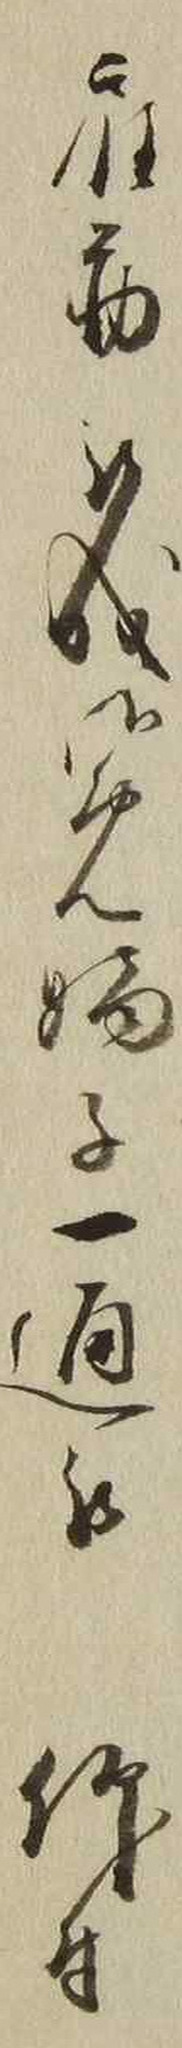雇勤被成御免嫡子一通被仰付
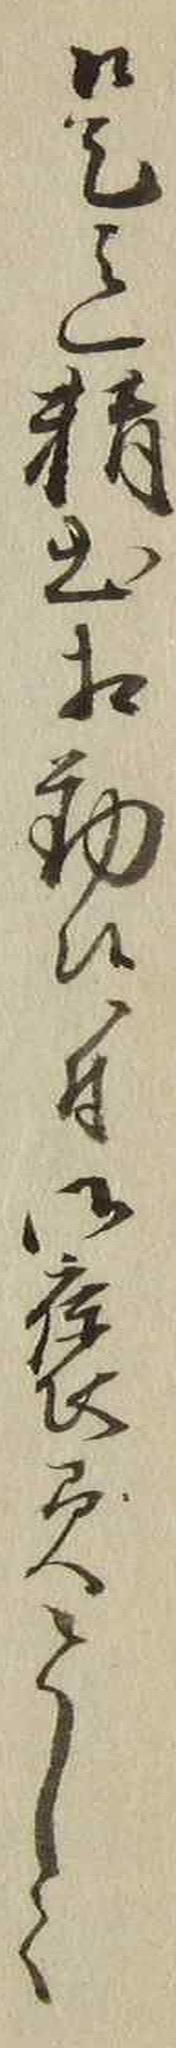是迄精出相勤候ニ付御褒美として
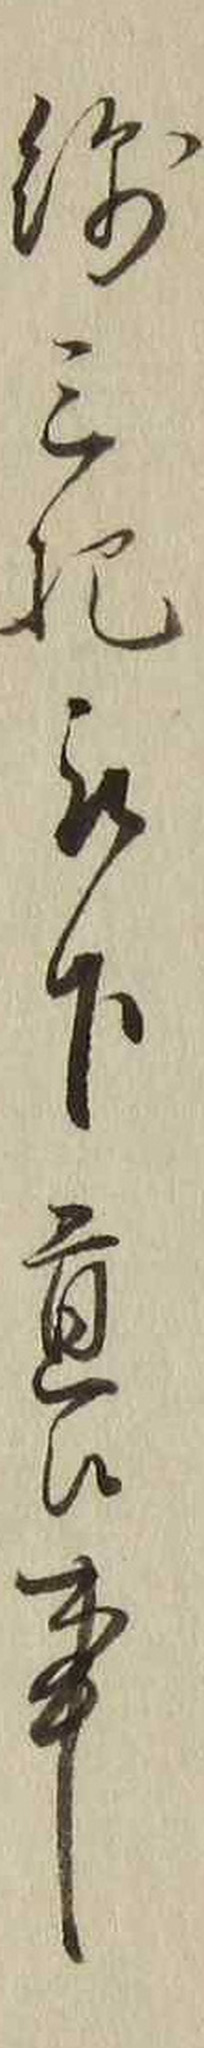綿三把被下置候事
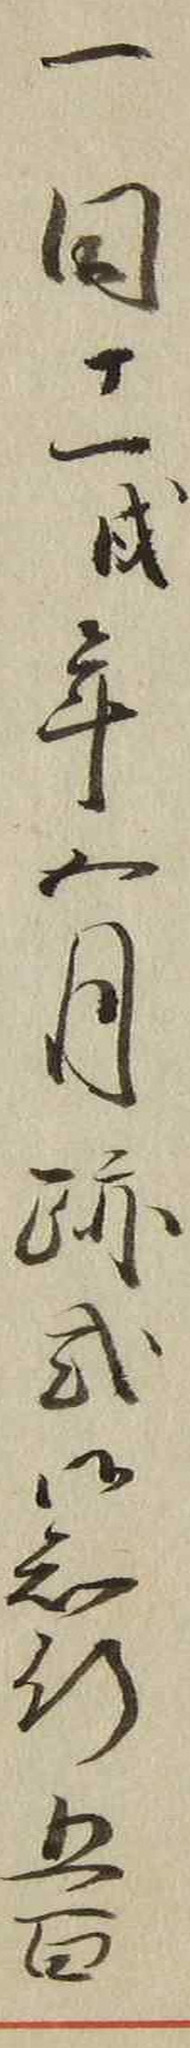一同十一戌年五月跡式御知行五百
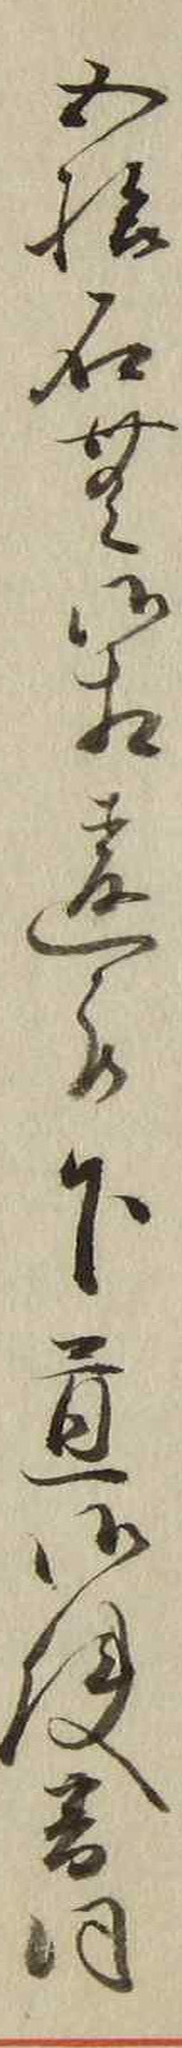五拾石無御相違被下置御使番同
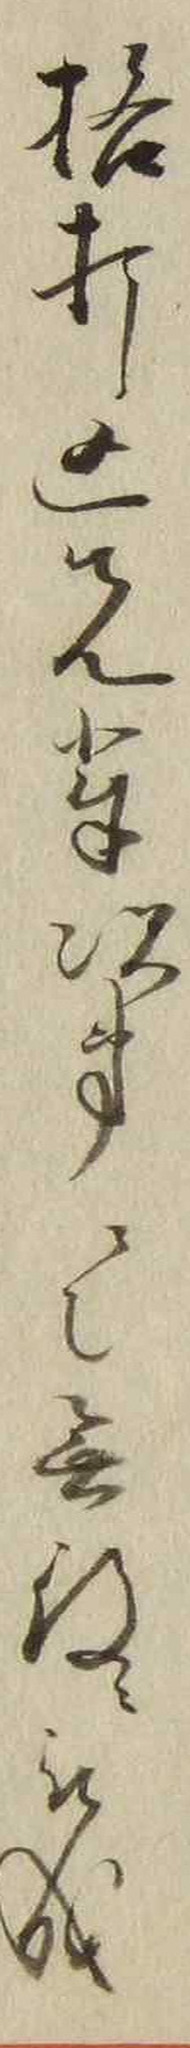格打込先輩次第ニて無役ニ被成
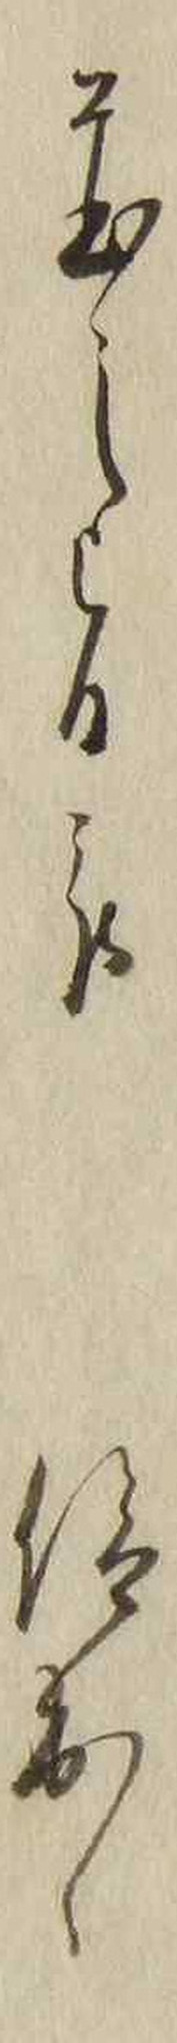置之旨被仰出候

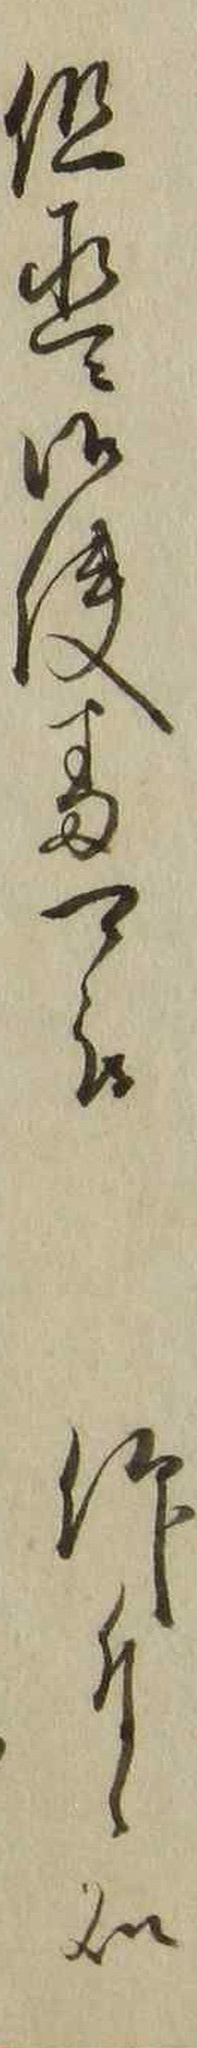但直ニ御使番可被仰付候処
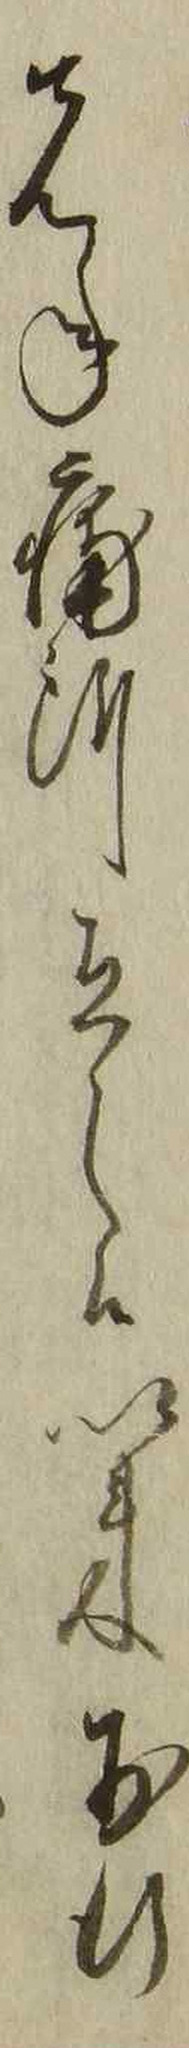先年痛所有之候以来歩行
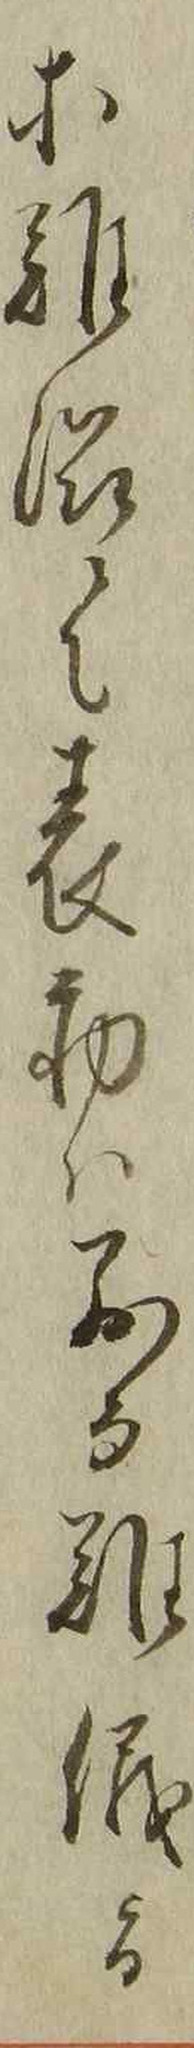等難渋ニて表勤ハ別而難儀与
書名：諸士系譜　巻之2　い之部2
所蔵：会津若松市立会津図書館
